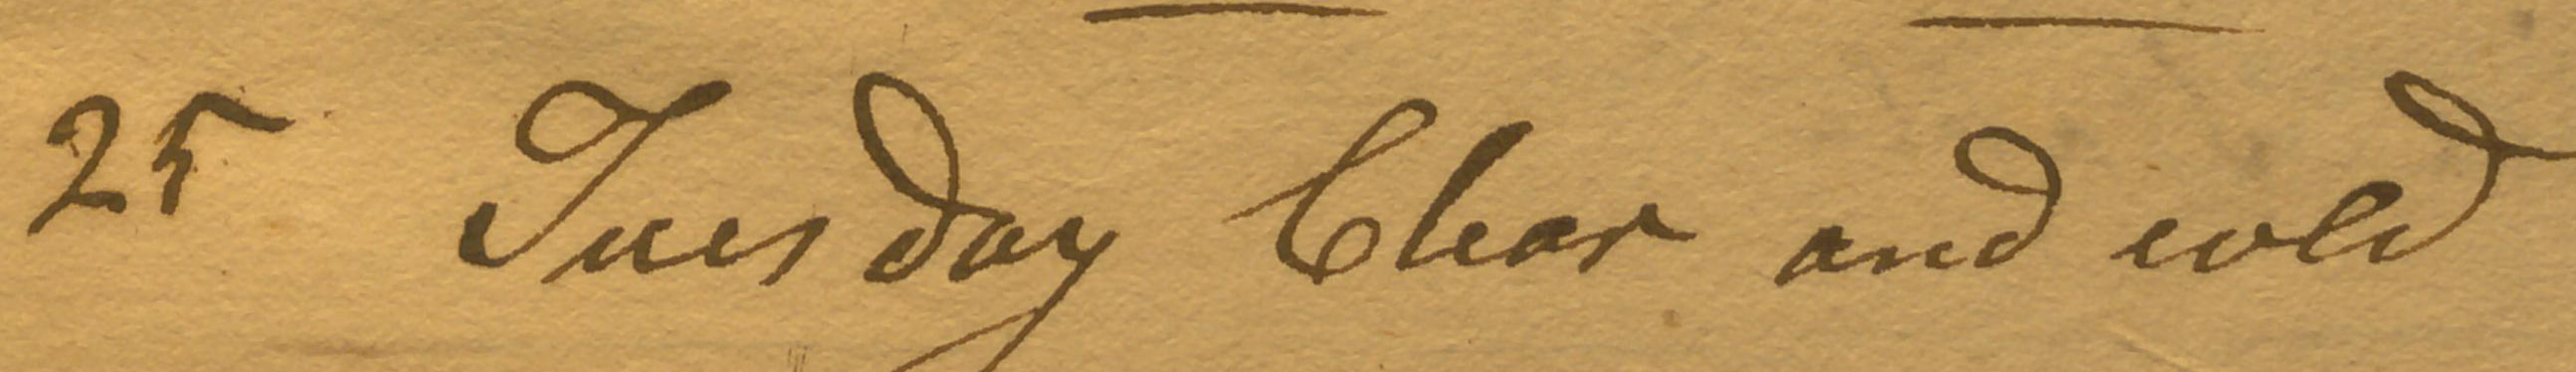25 Tuesday Clear and cold
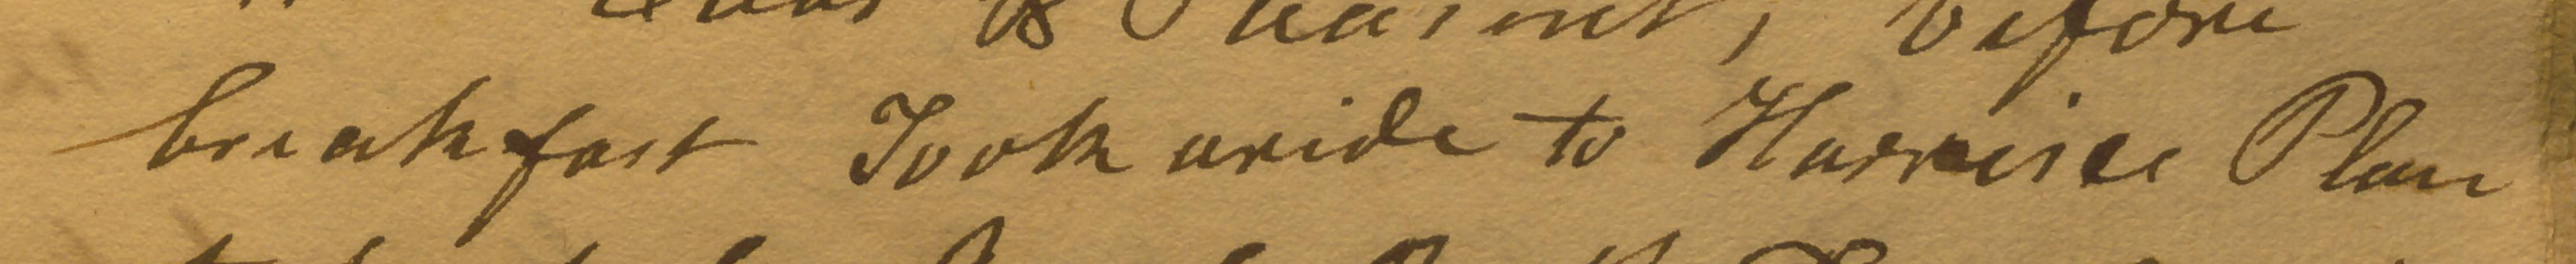breakfast Took a ride to Harrises Plan
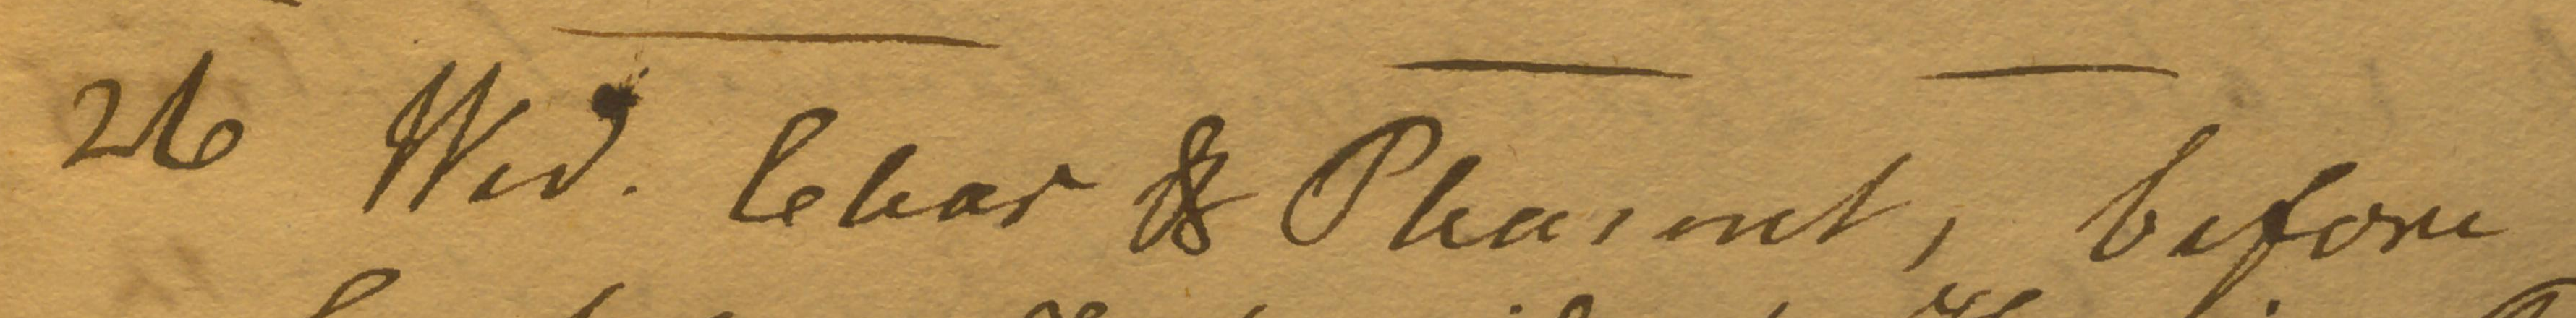26 Wed. Clear & Pleasent, before
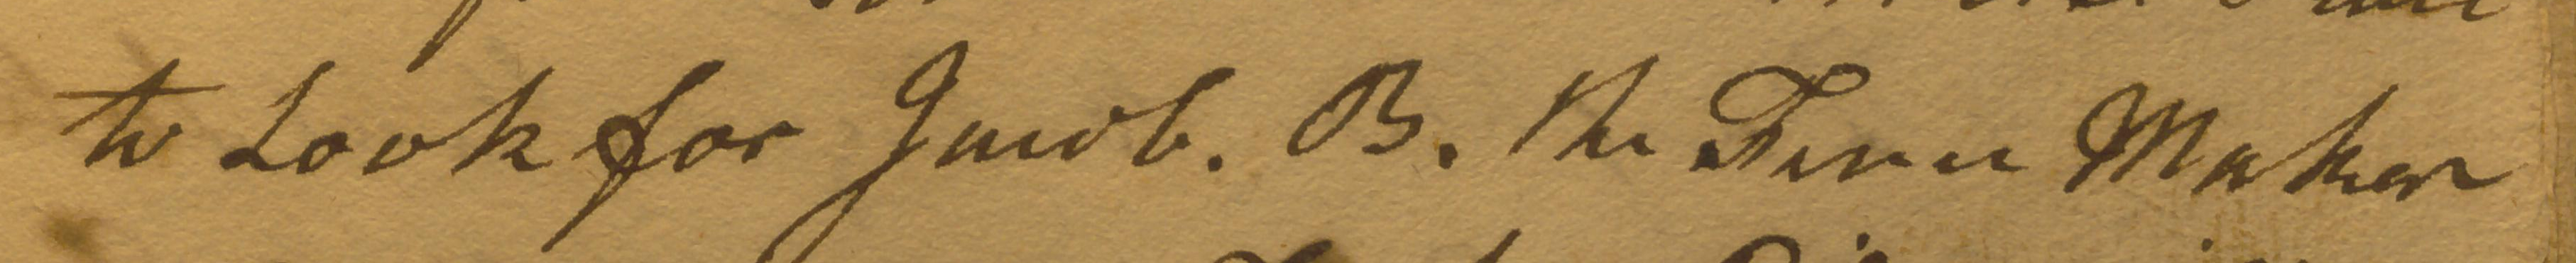to Look for Jacob. B. the Fence Maker
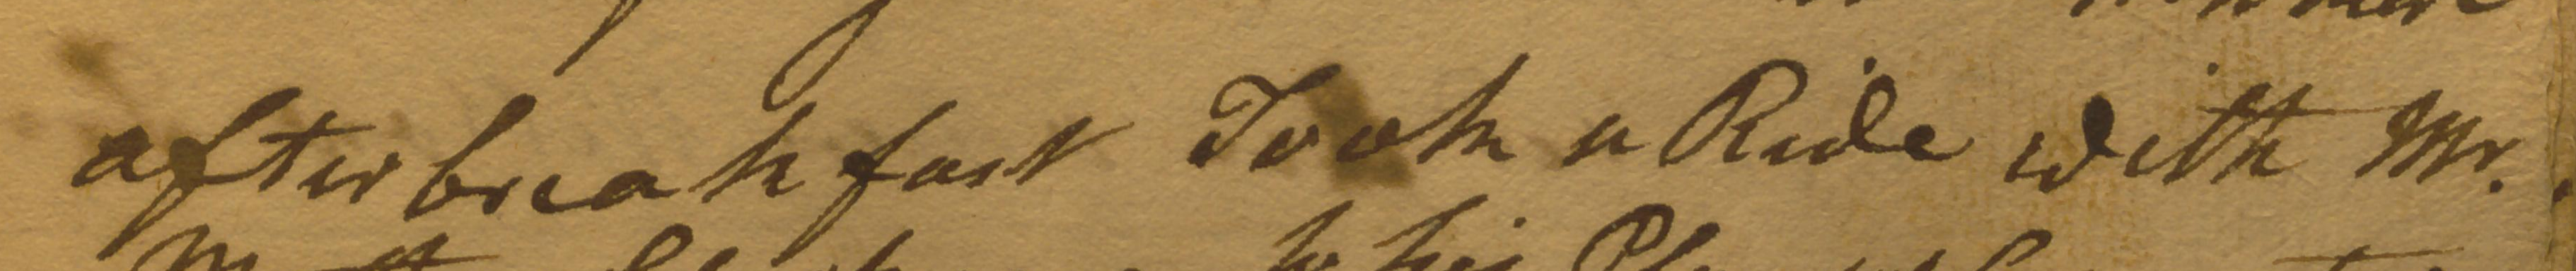after breakfast Took a Ride with M^r.
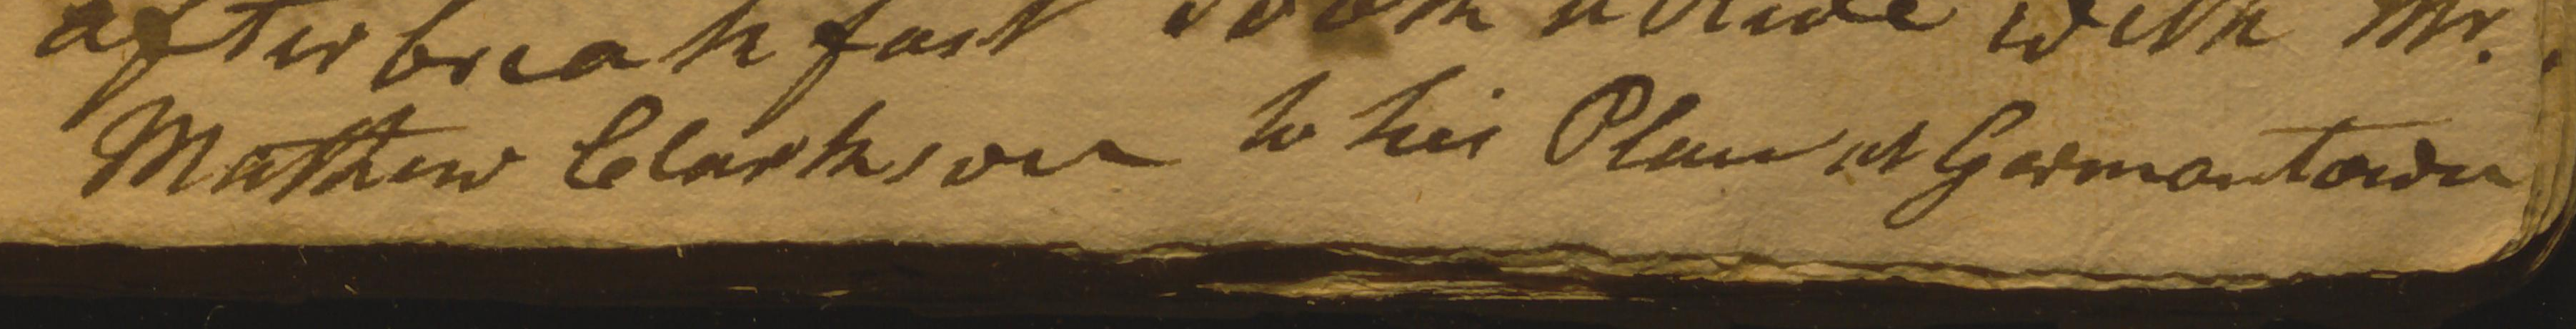Mathen Clarkson to his Plan at Germantown
